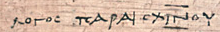λογοϲ παραιϲχινου
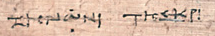ζηνωνι τηϲκρι
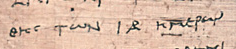θηϲ των ι Ǻ ημερων
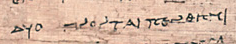δυο γινονταιπενθημι
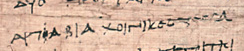αρταβιαχοινικεϲτεϲϲα
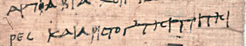ρεϲ καιαριϲτοντηιτριτηι
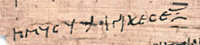ημυϲυχοινικεϲεξ
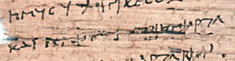καιημιονωιτριημιαρτα
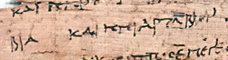βια καιημιαρταβιον
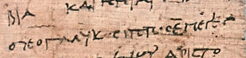οτεογλαυκοϲιπποϲεμενεν
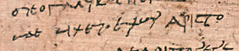ωδε ωιχετοεχων αριϲτο
